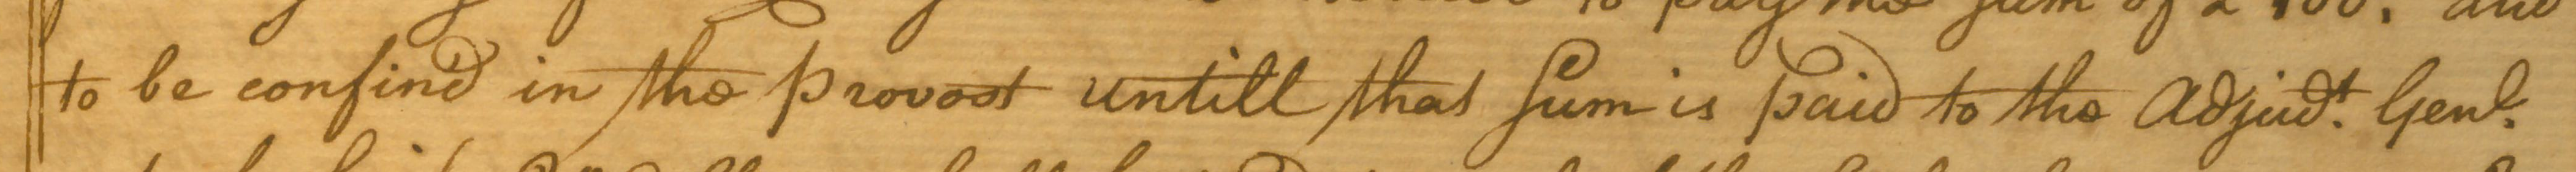to be confin'd in the provost untill that sum is paid to the Adjud^t. Gen^l.
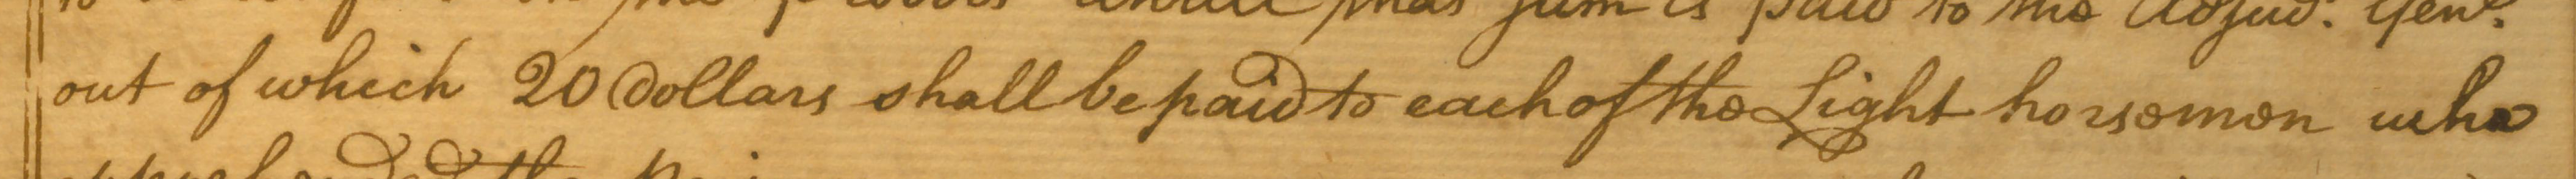out of which 20 dollars shall be paid to each of the Light horsemen who
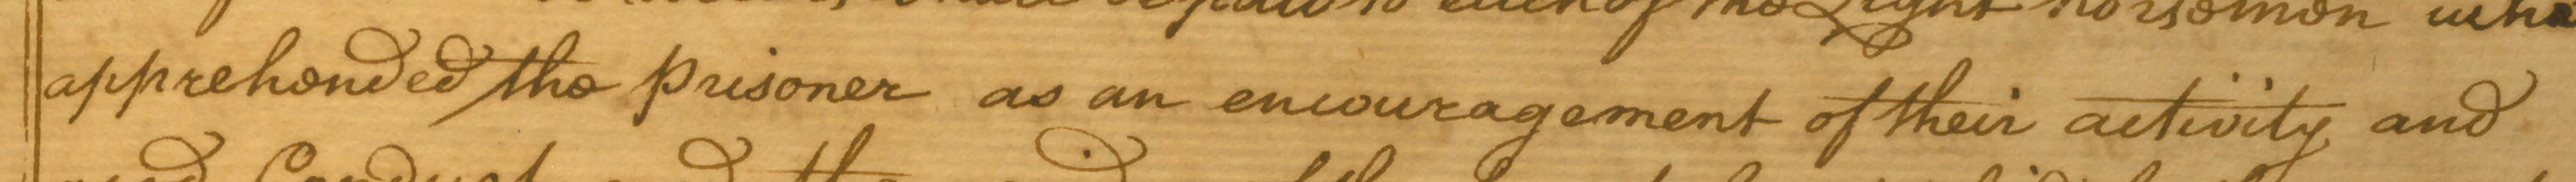apprehended the prisoner as an encouragement of their activity and
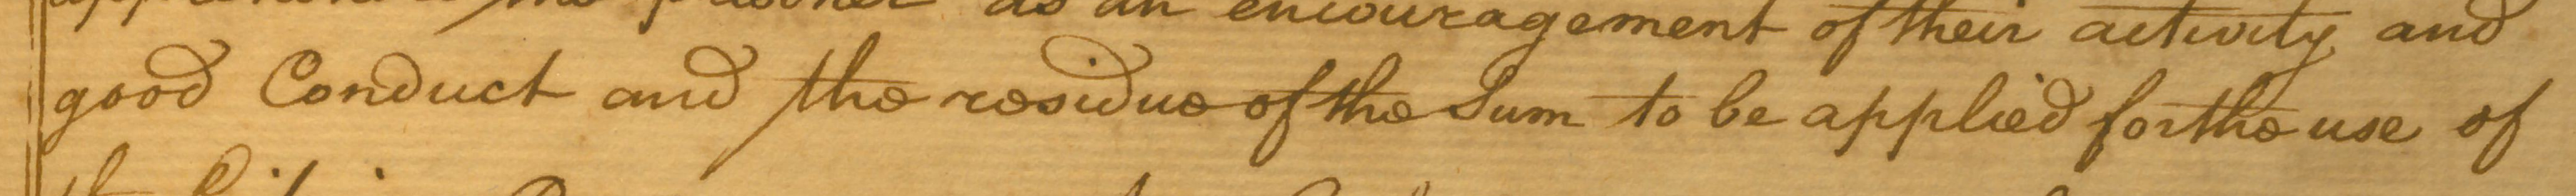good Conduct and the residue of the Sum to be applied for the use of
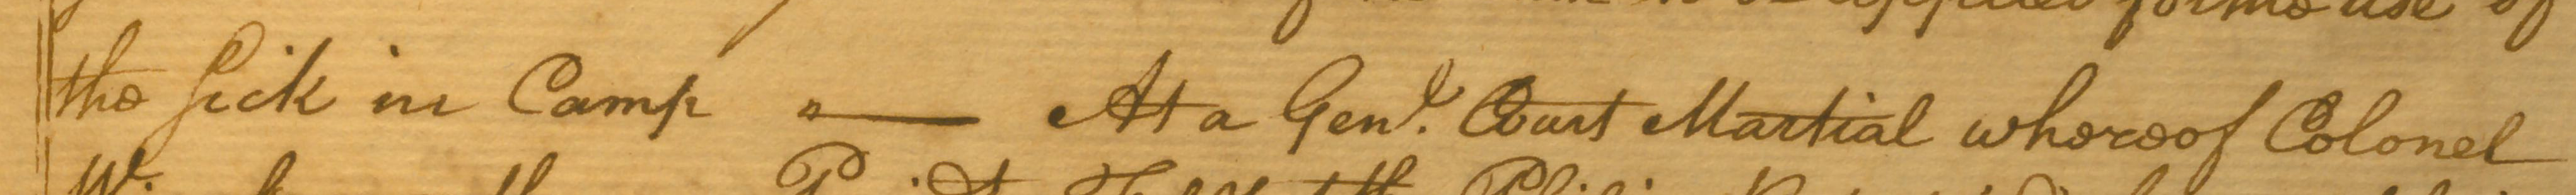the sick in Camp- At a Gen^l. Court Martial whereof Colonel
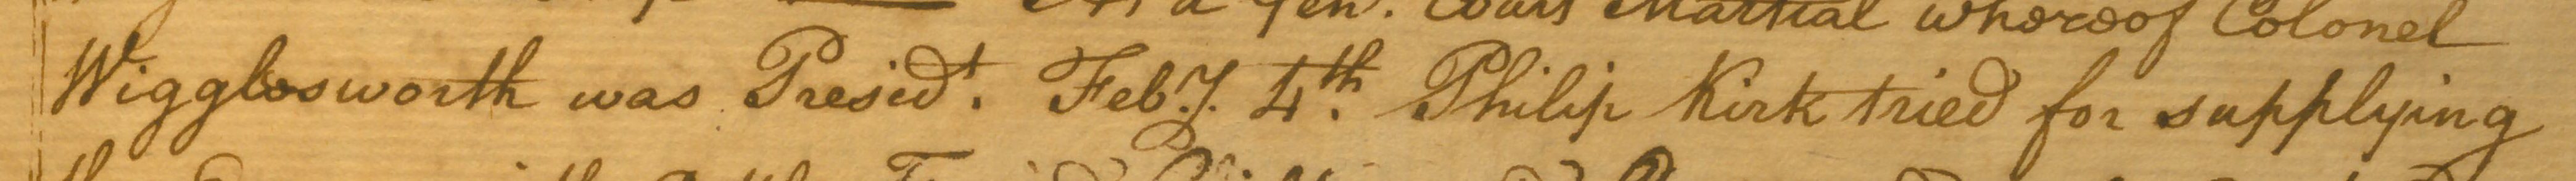Wigglesworth was Presid^t. Feb^y. 4^th. Philip Kirk tried for supplying
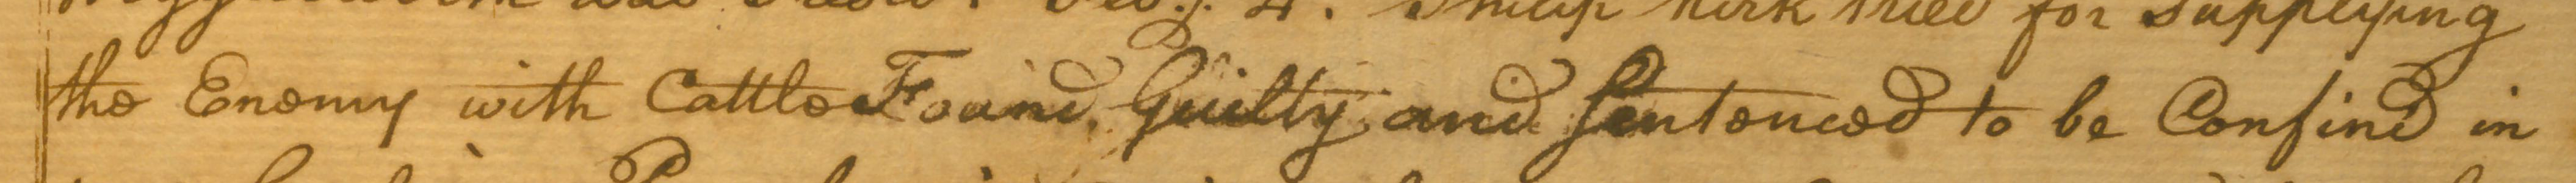the Enemy with Cattle Found Guilty and sentenced to be Confin'd in
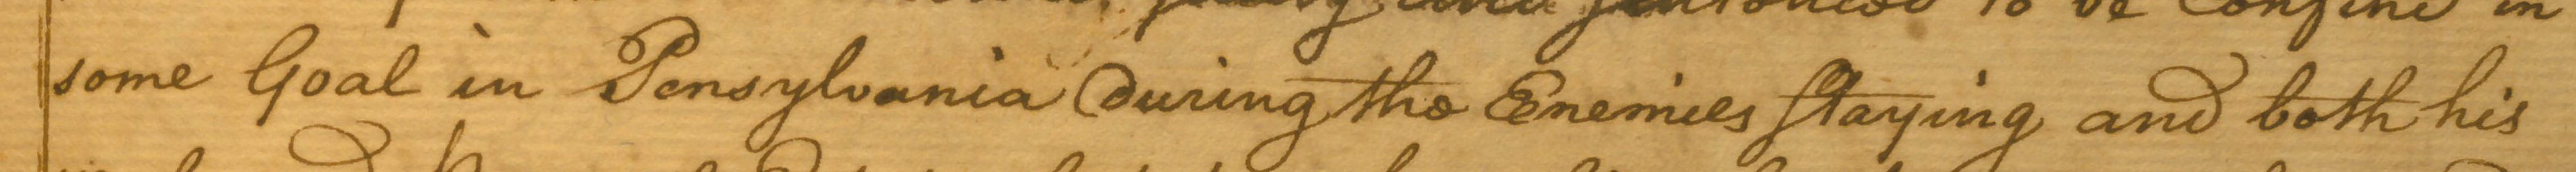some Goal in Pensylvania during the Enemies staying and both his
